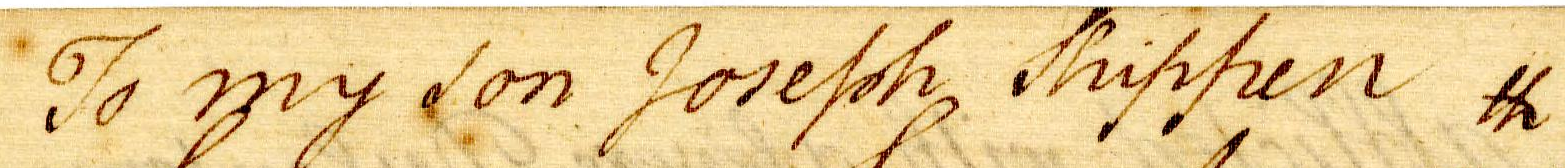To my son Joseph Shippen
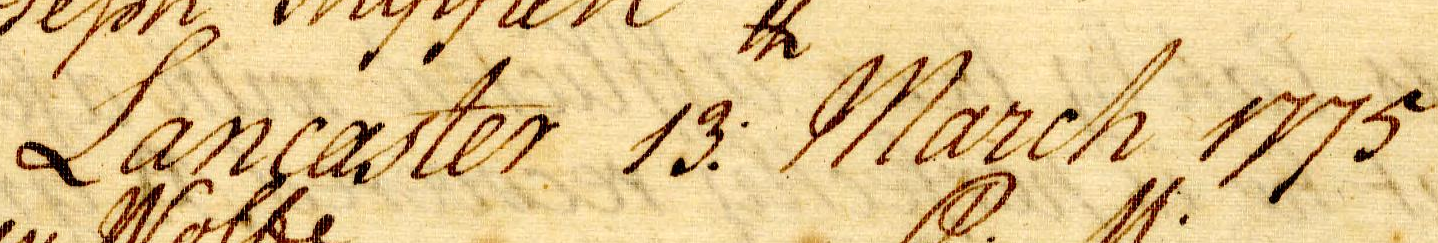Lancaster 13:^th March 1775
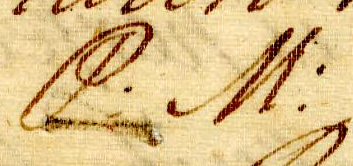P.M:
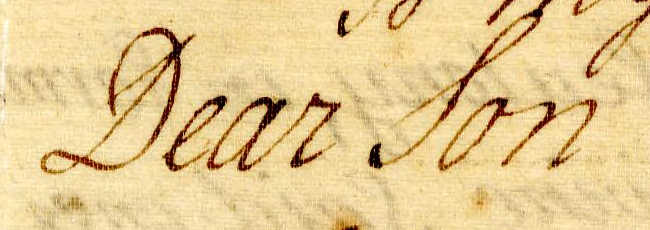Dear Son
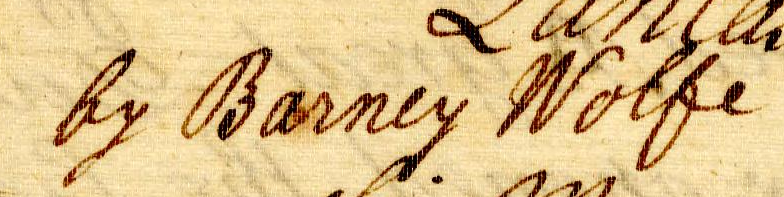by Barney Wolfe
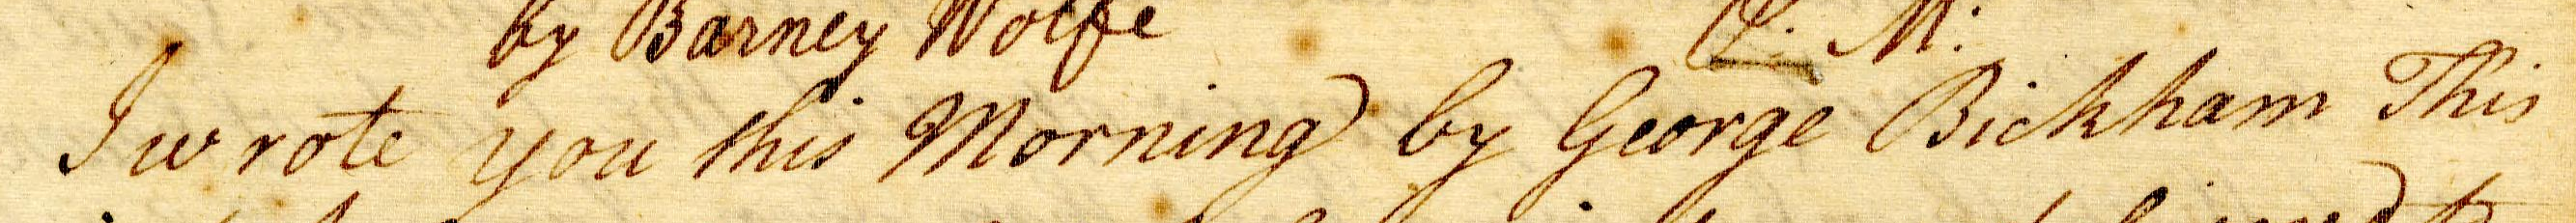I wrote you this Morning by George Bickham This
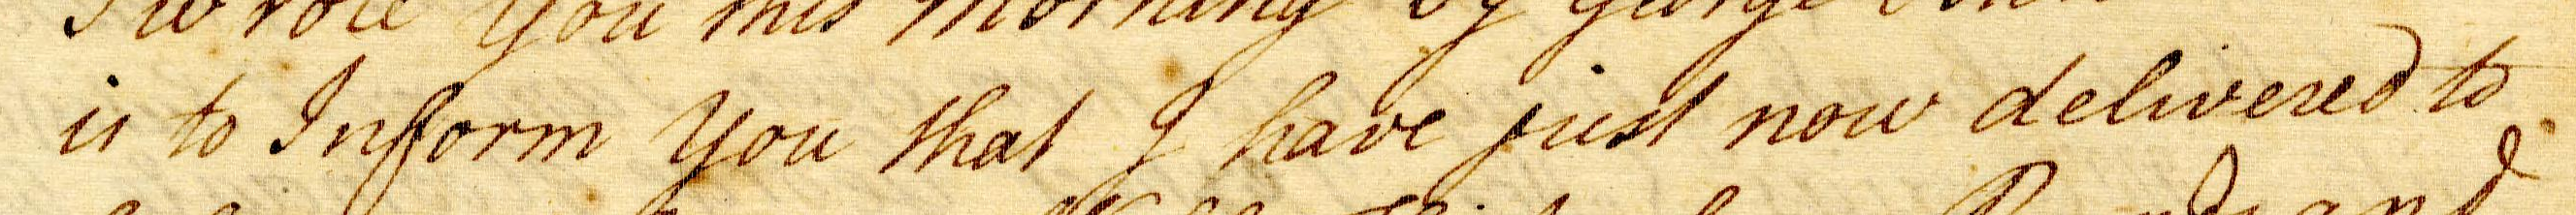is to Inform You that I have just now delivered to
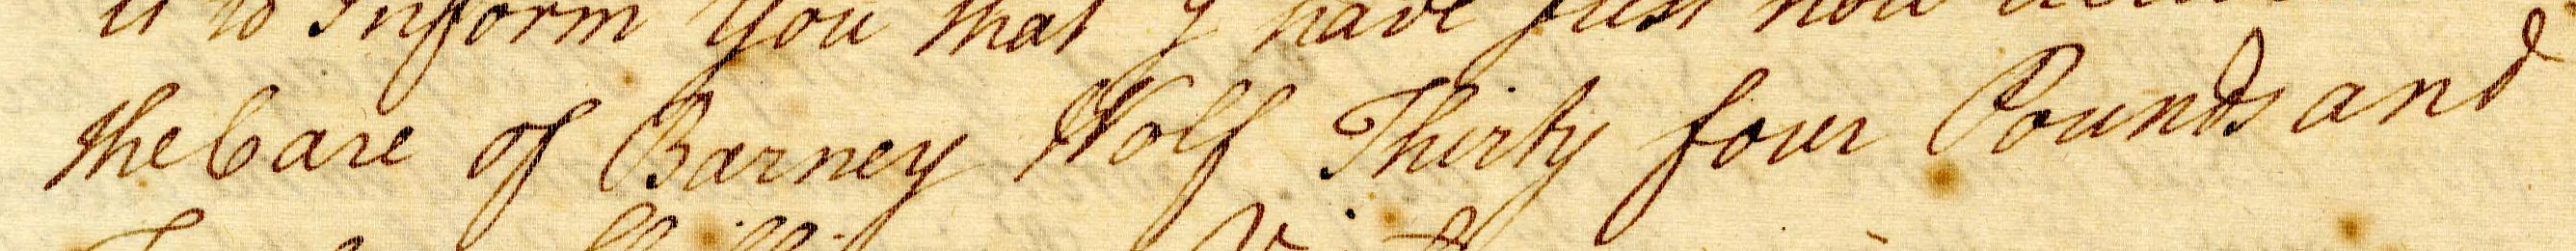the Care of Barney Wolf Thirty four Pounds and
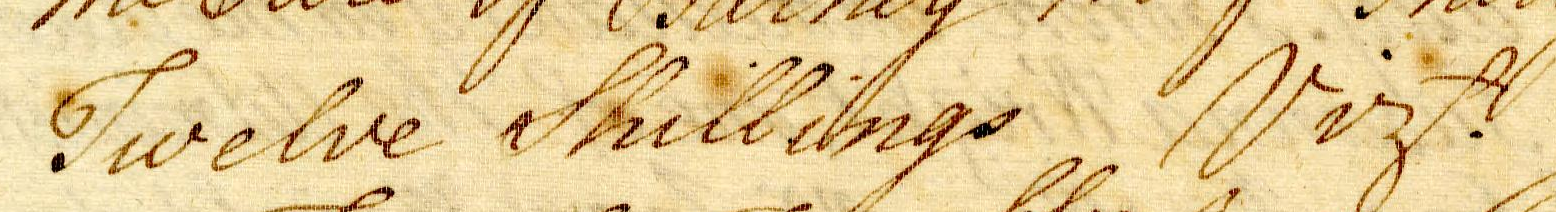Twelve Shillings Viz^t.
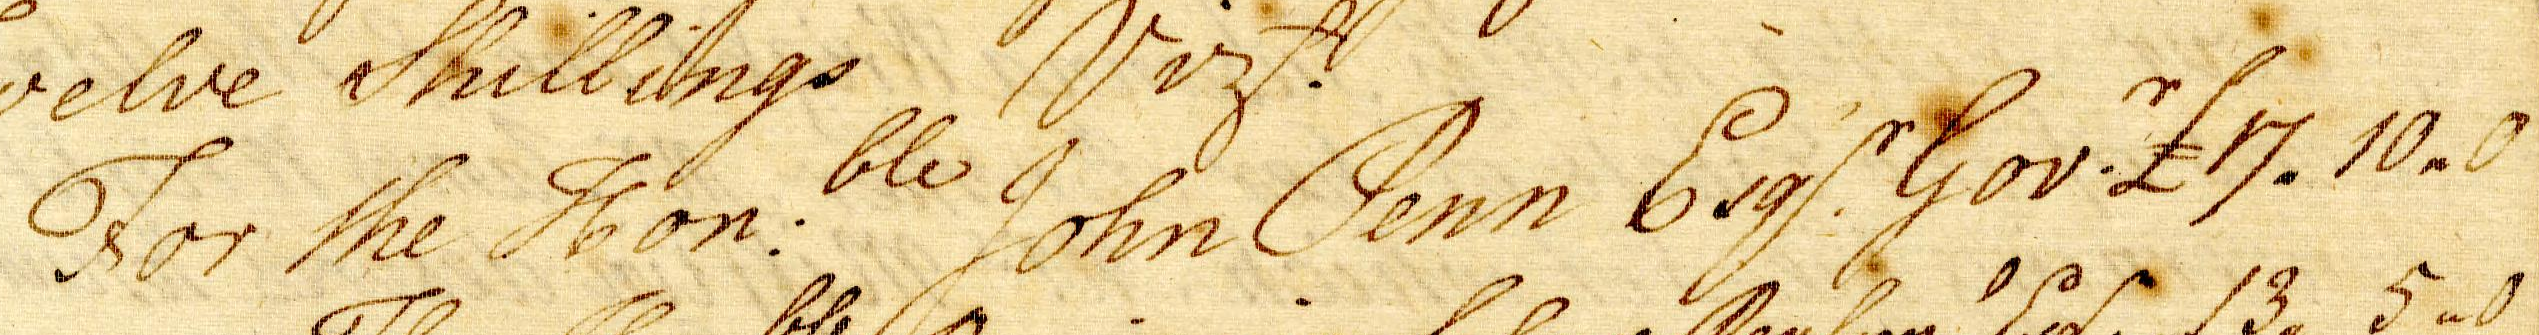For the Hon:^ble John Penn Esq^r. Gov.^r £17..10..O
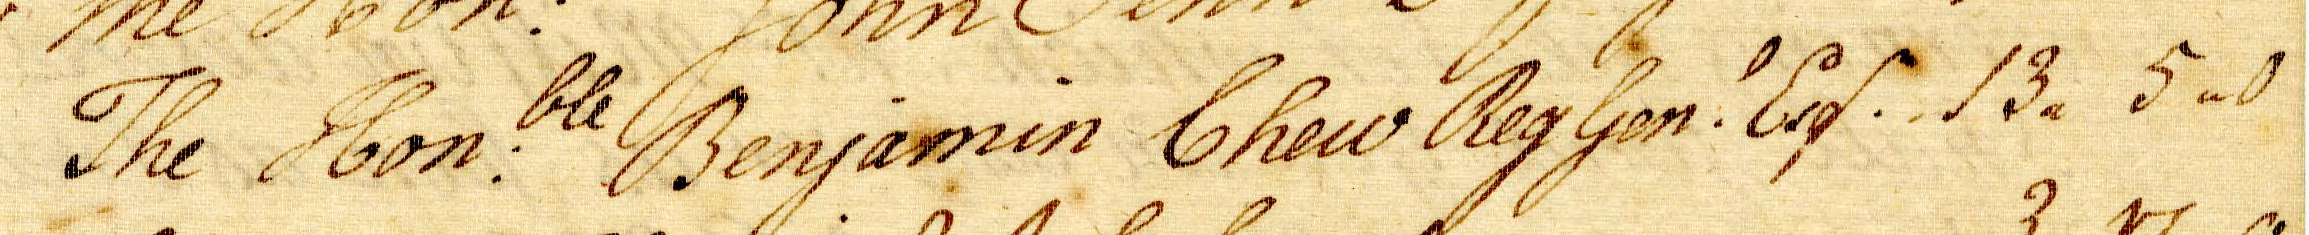The Hon:^ble Benjamin Chew Reg Gen.^l Esq^r.. 13..5..0
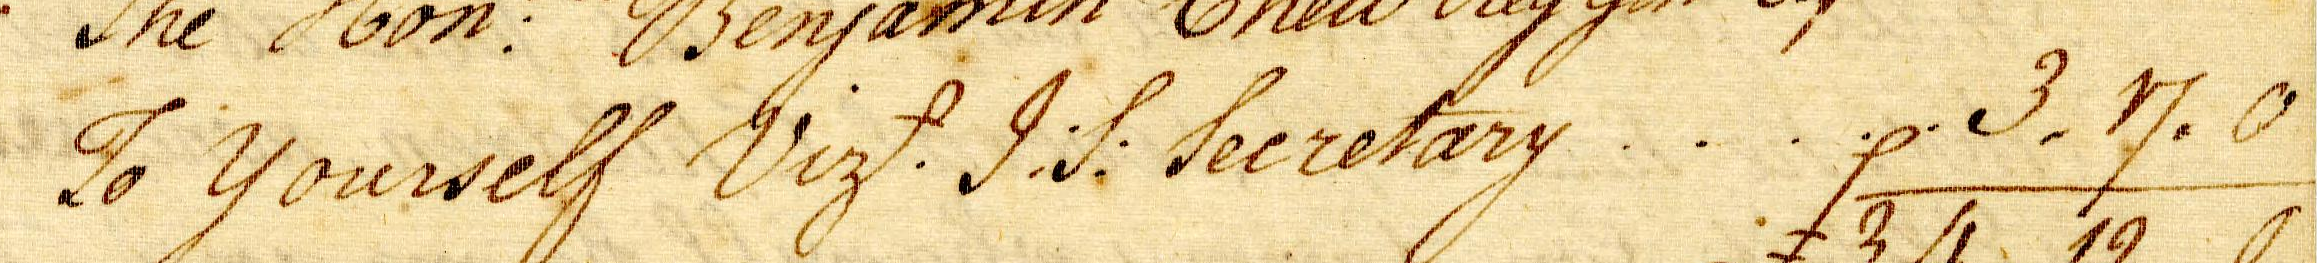To Yourself Viz^t. J:S: Secretary.....3. 17.O
